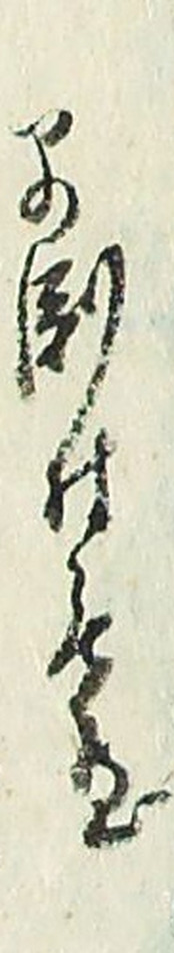早淵村庄屋
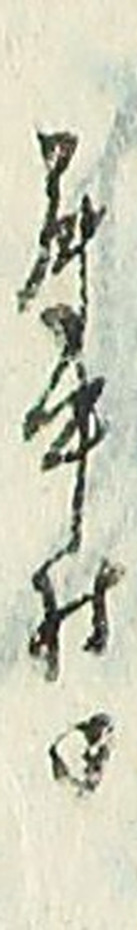府中村同
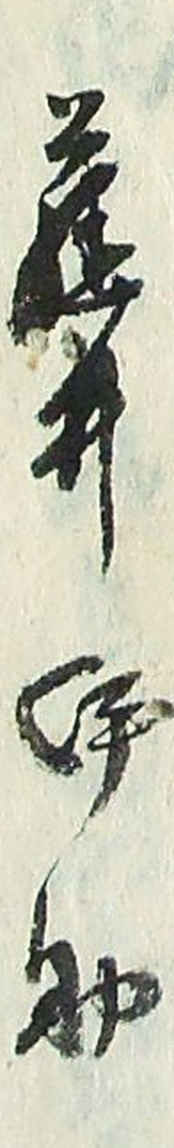藤井伊助

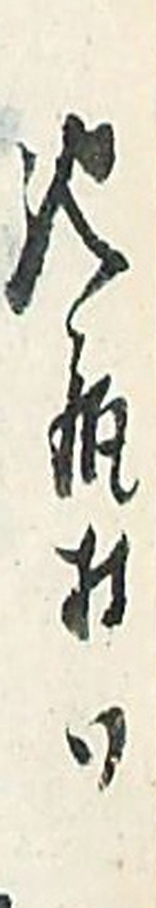池尻村同
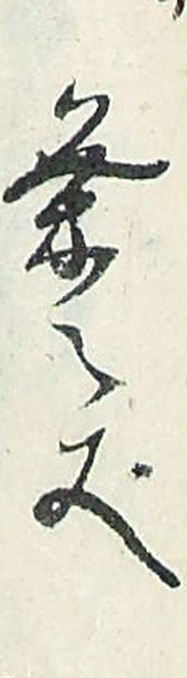久米之丈
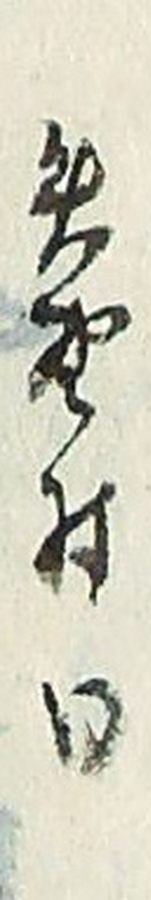矢野村同
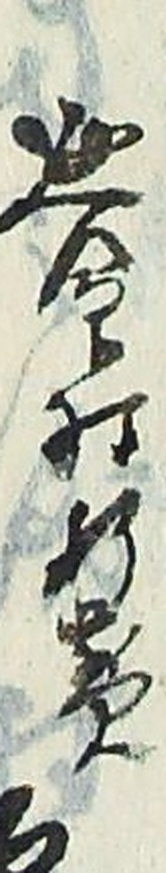延命村肝煎
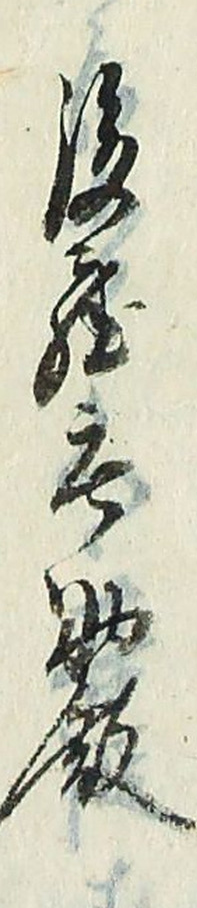後藤庄助殿
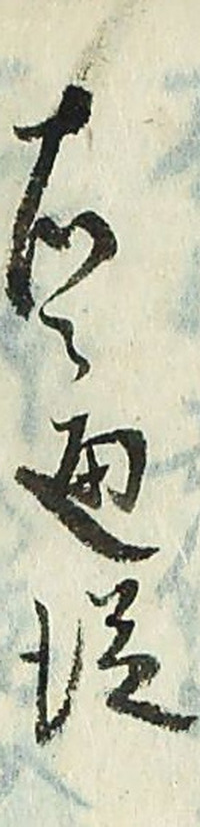右之通従
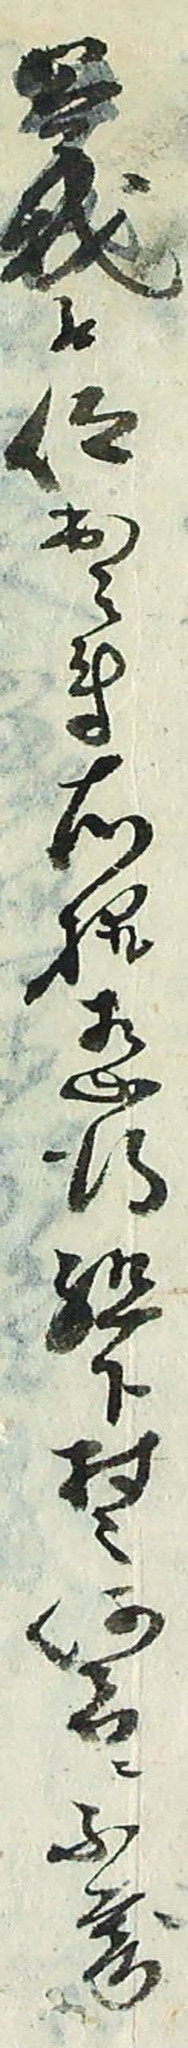公義被仰出候に付右様相心得組下村々何者に不寄
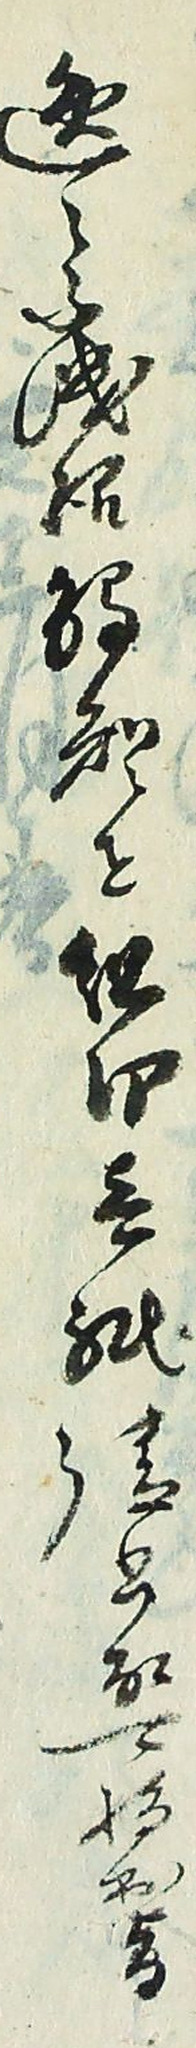逸々不洩様触知らせ組切壱紙請書取可指出旨
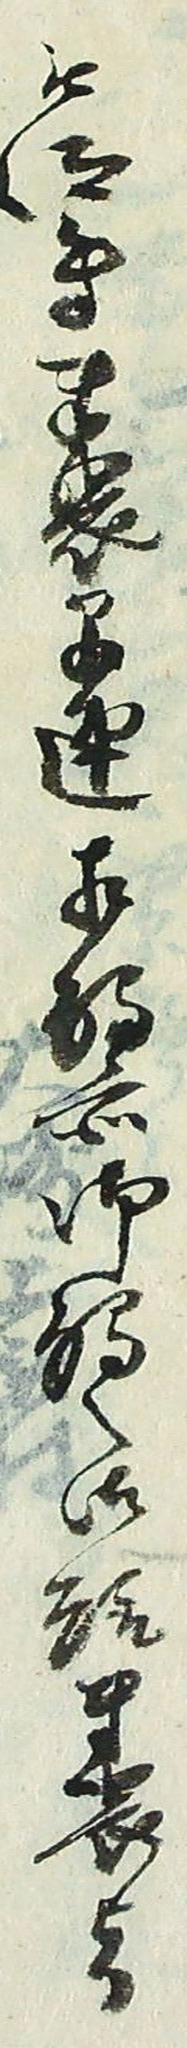被仰付奉畏早速相触候所御触之御趣奉畏旨
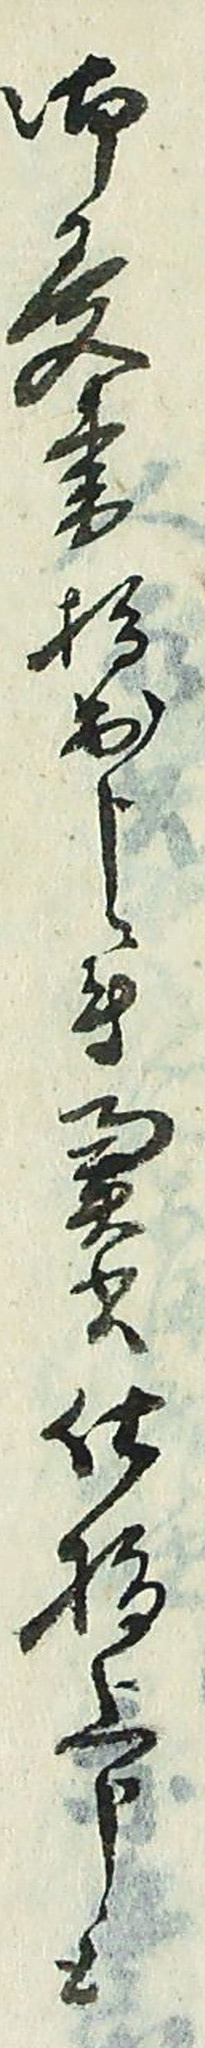御受書指出申に付奥書仕指上申候以上
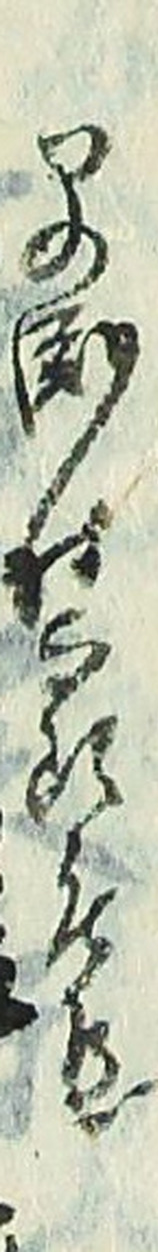早淵村与頭庄屋
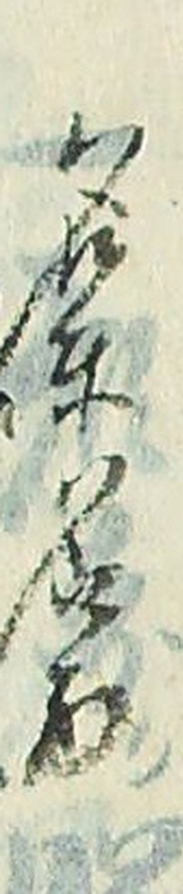名東名西
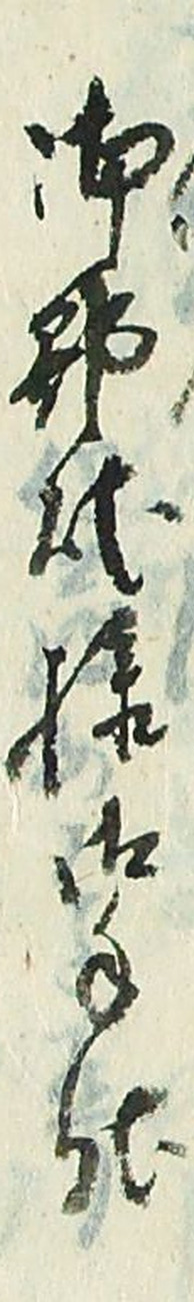御郡代様御手代
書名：諸御用御□受書控
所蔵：鳴門教育大学 Naruto University of Education
